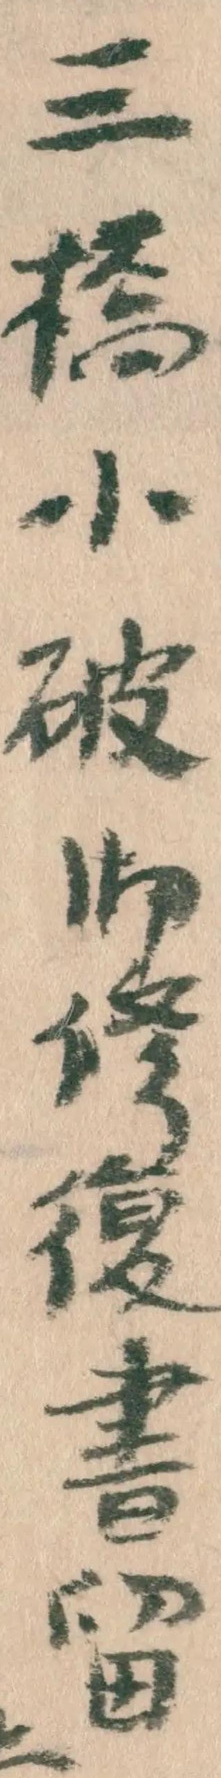三橋小破御修復書留上

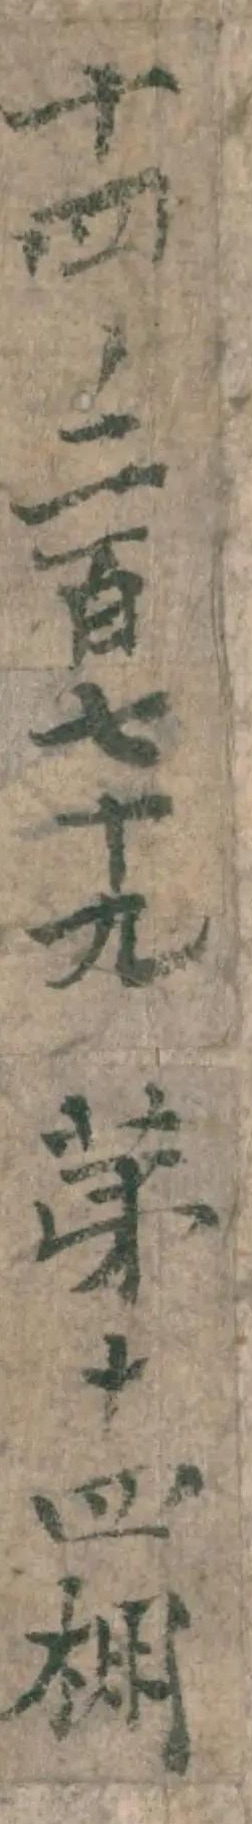十四ノ二百七十九第十四棚
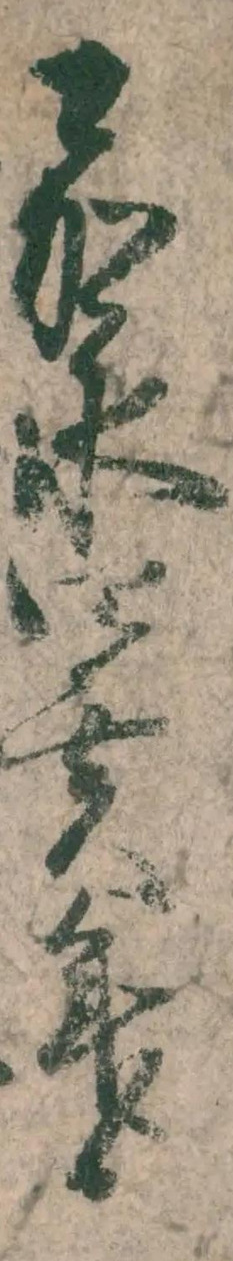嘉永四亥年ゟ
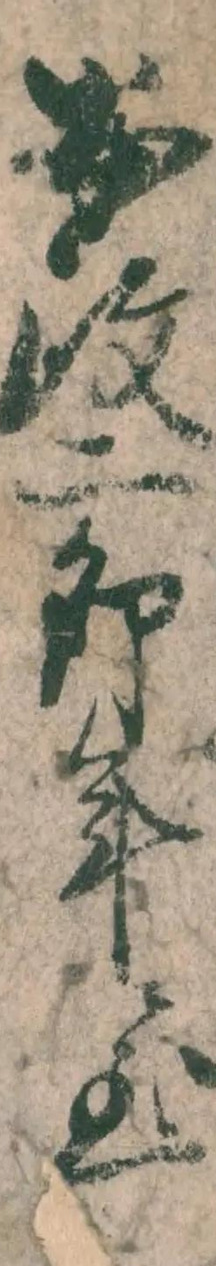安政二卯年迄
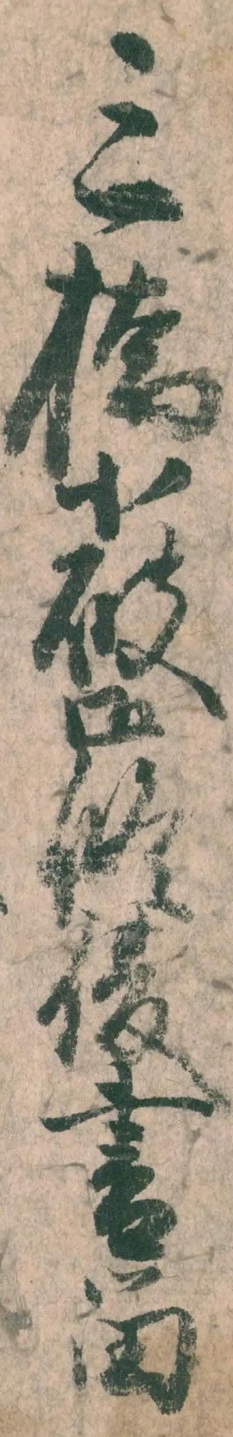三橋小破御修復書留
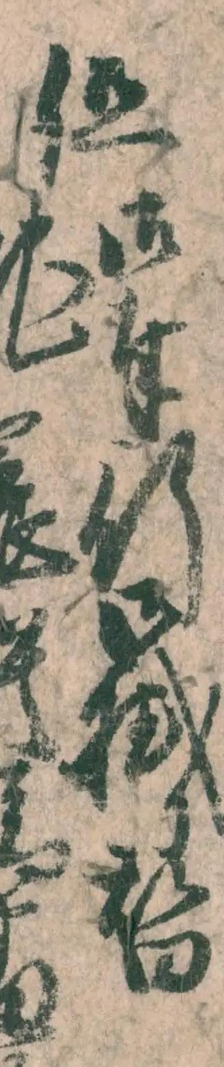但御奉行御掛り替
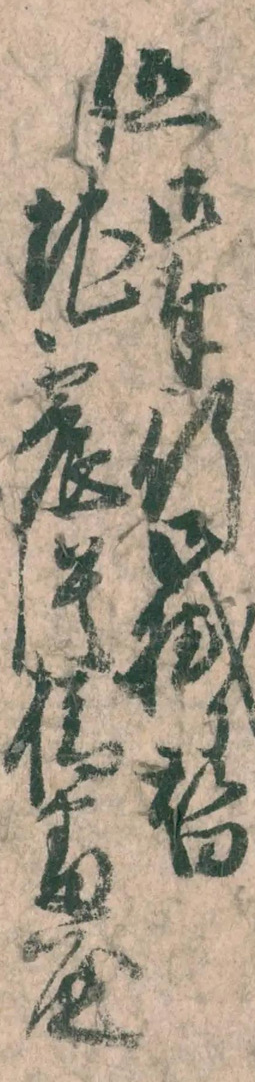地震潰橋番屋

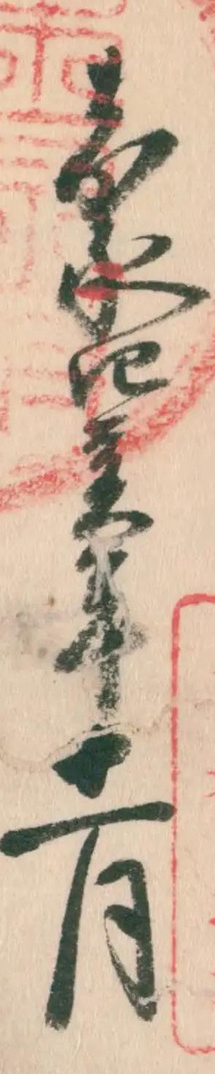嘉永四亥年十一月
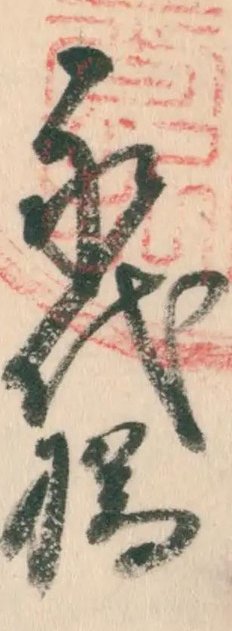永代橋
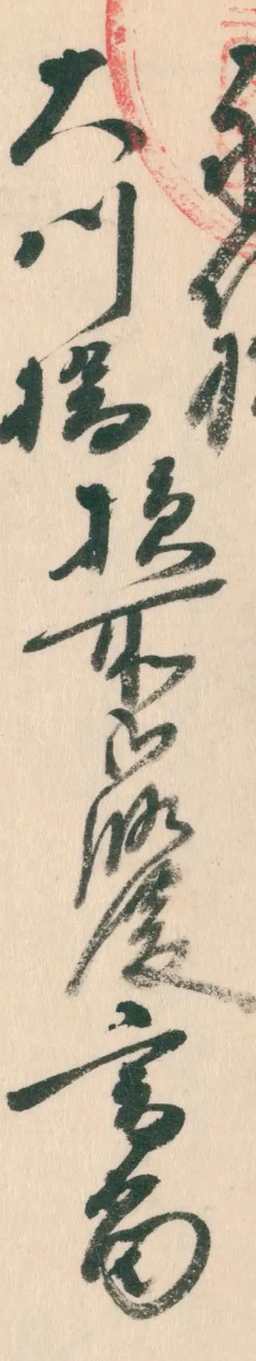大川橋損所御修復書留

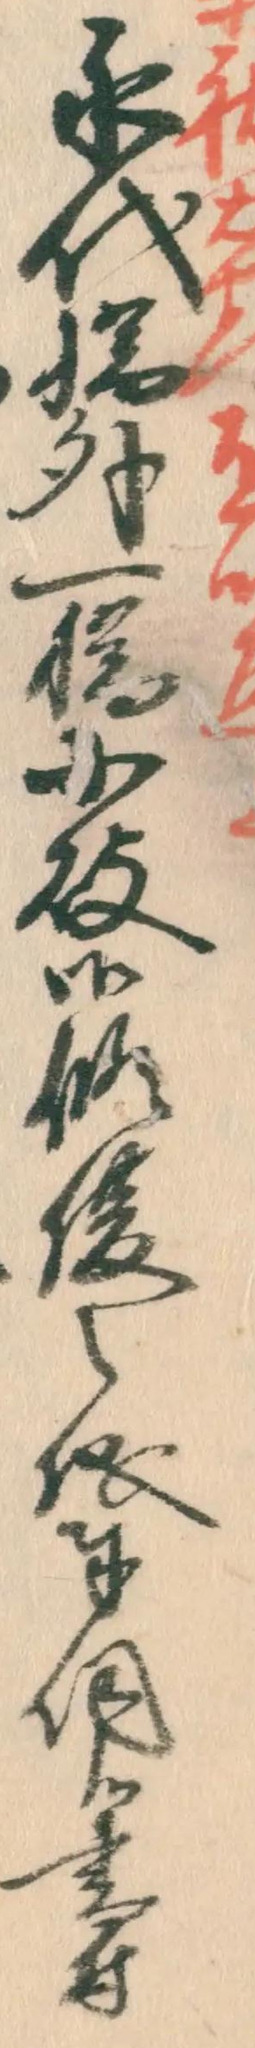永代橋外一橋小破御修復之儀奉伺候書付
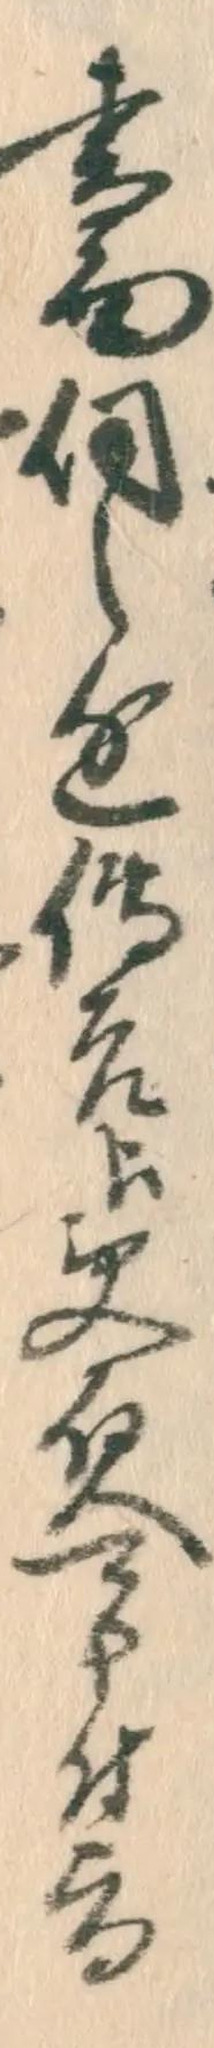書面伺之通伝吉え受負可申付旨
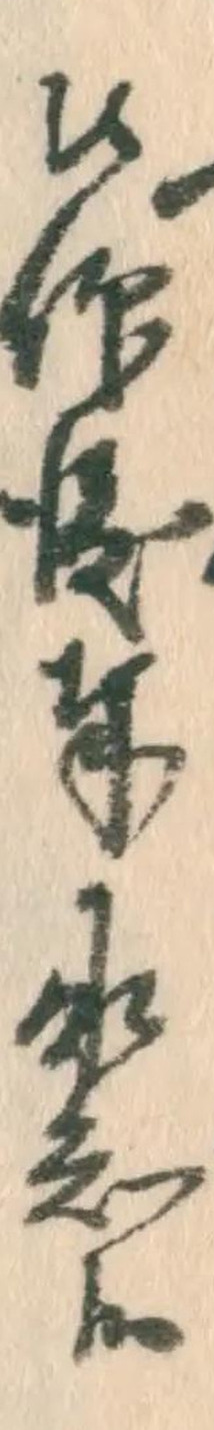被仰渡奉承知候
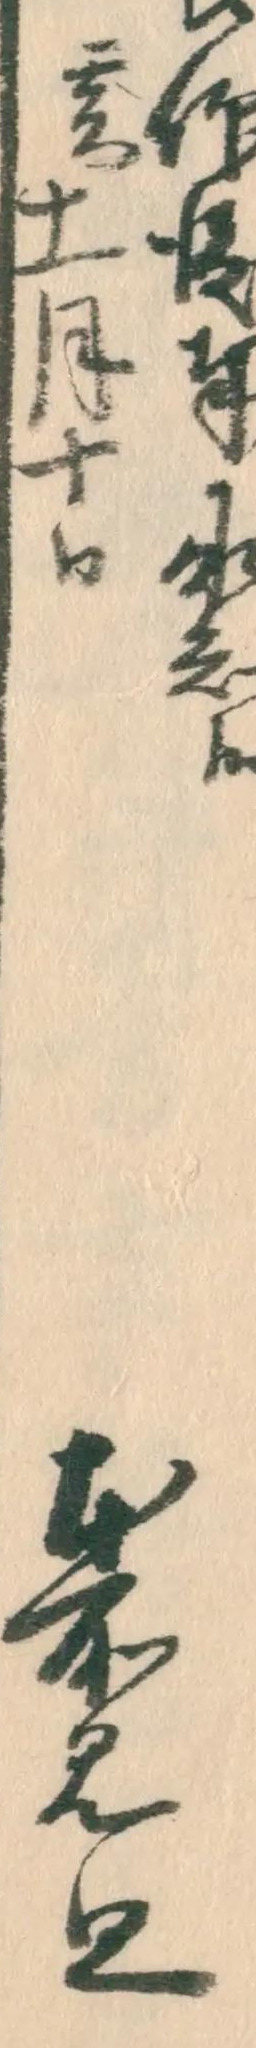亥十一月十日本所見廻
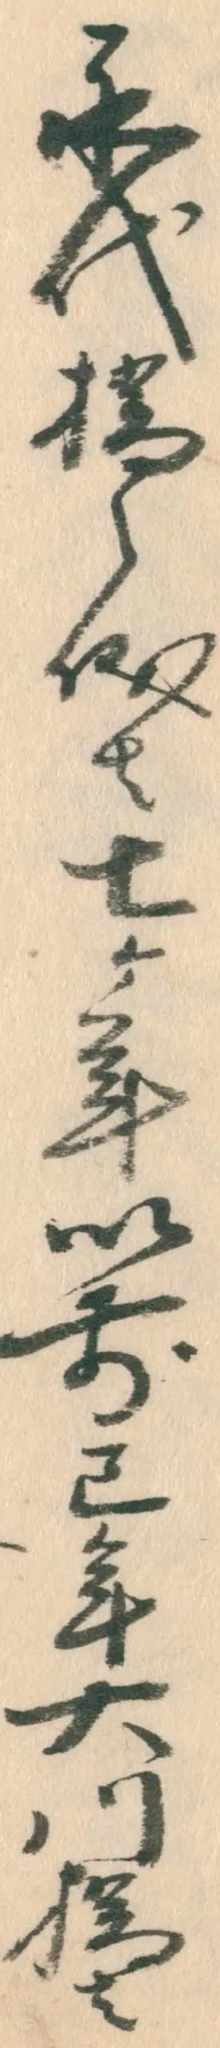永代橋之儀は七ケ年以前巳年大川橋は
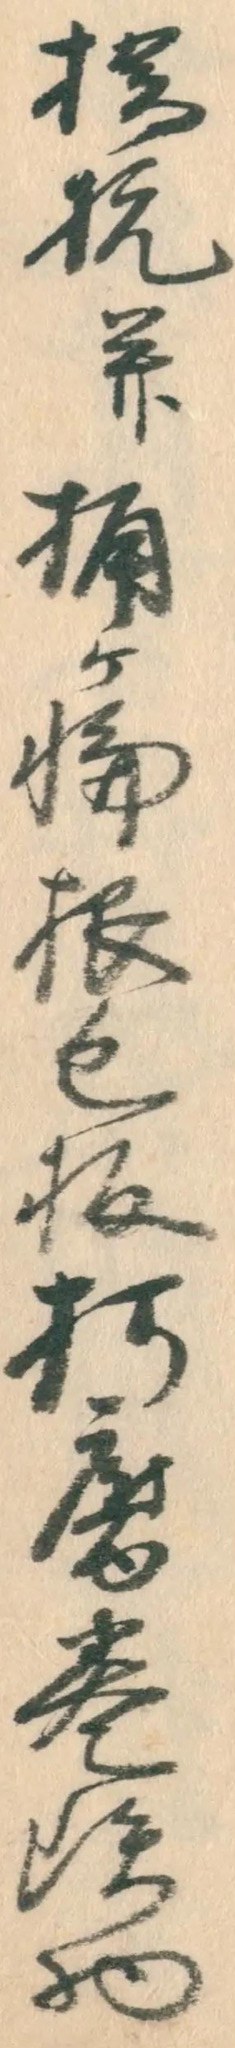橋杭并桶ケ輪根包板朽腐巻鉄物
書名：三橋 17巻. [7] 三橋小破御修復書留　但御奉行御掛リ替地震潰橋番屋　嘉永四亥年より安政二卯年迄　上
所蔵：国立国会図書館 National Diet Library, JAPAN
